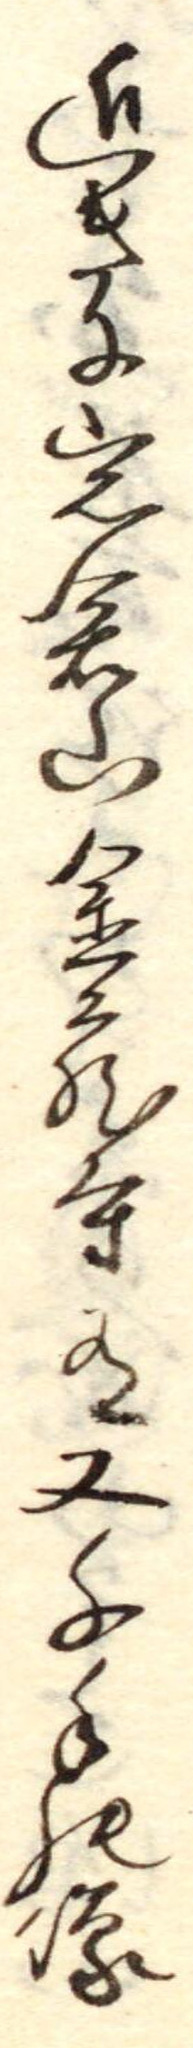近きに岩倉山金蔵寺有又千手の像
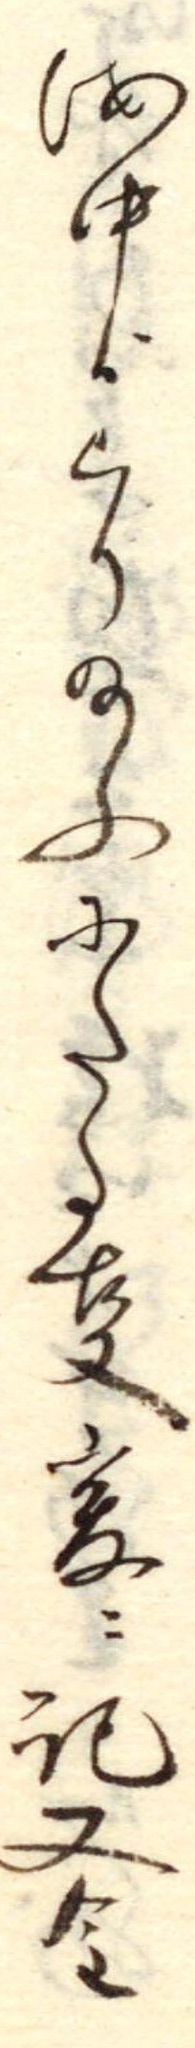海中ゟ上り給ふにたる事爰に記又金
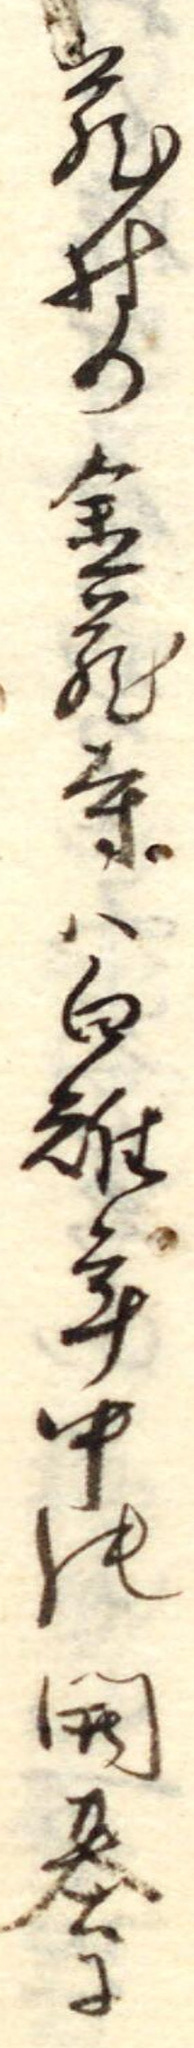蔵村の金蔵寺は白雉年中の開基に
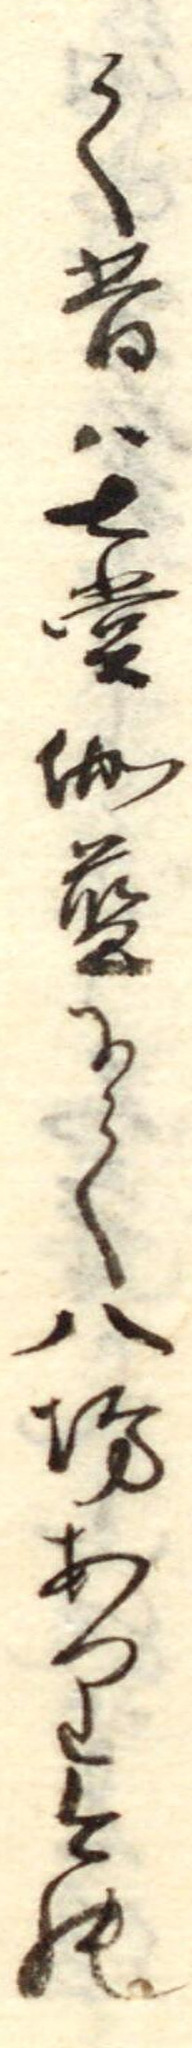て昔は七堂伽藍にて八坊あり今の
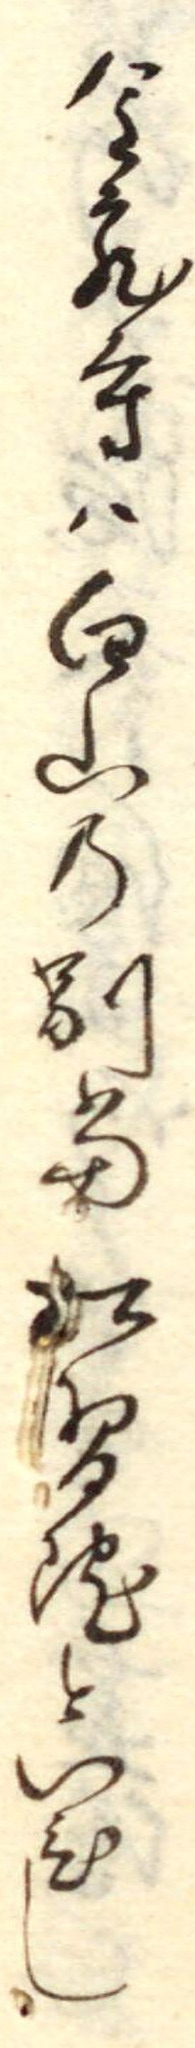金蔵寺は白山の別当松習院といひし
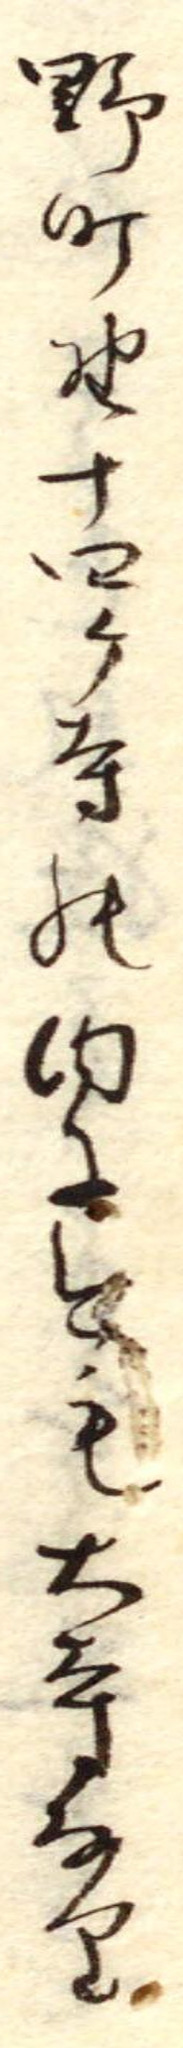野町の十四ヶ寺の内に今も大寺なり
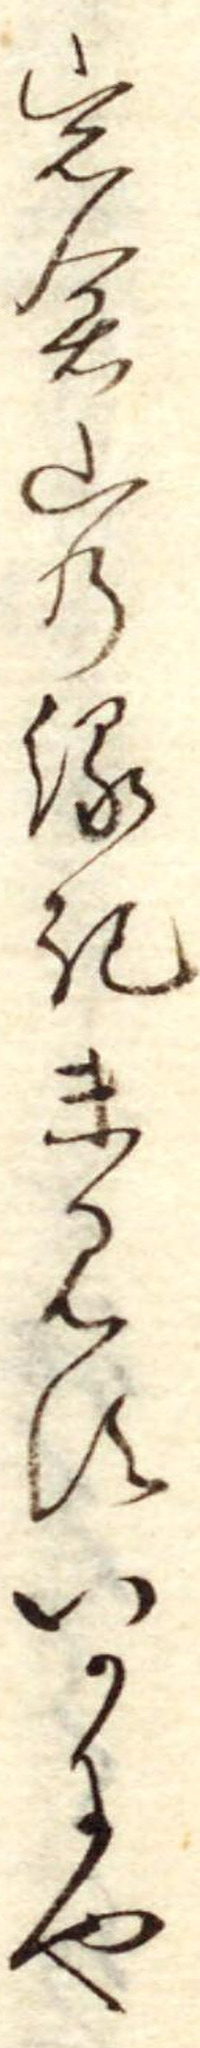岩倉山の縁起未見すいかにや
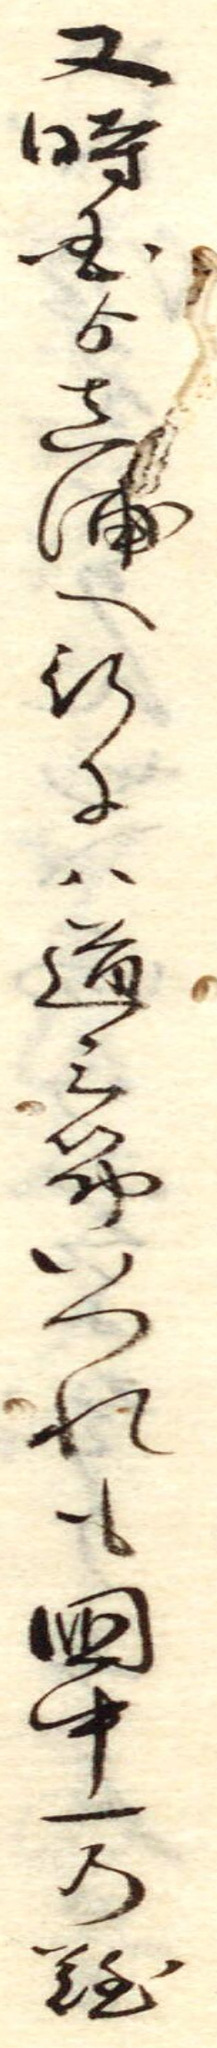又時国ゟ真浦へ行には道三筋いつれも国中一の難
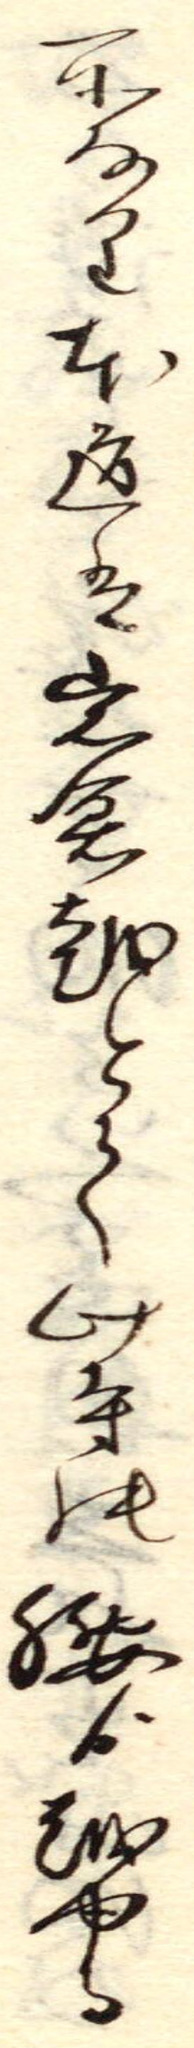所なり本道は岩倉越とて此寺の腰ゟ越ゆる
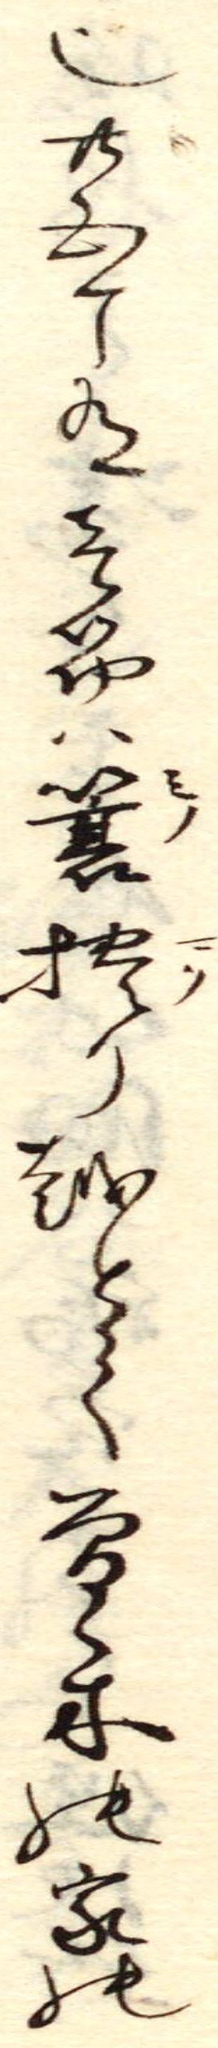也廿五丁有壱筋は簔捲り越とて曽々木の家の
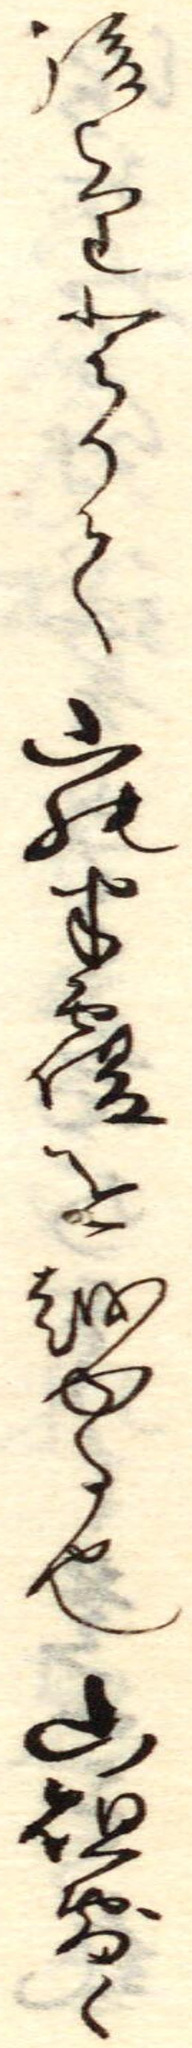後よりとりて山の半覆を越ゆる也山砠敷く
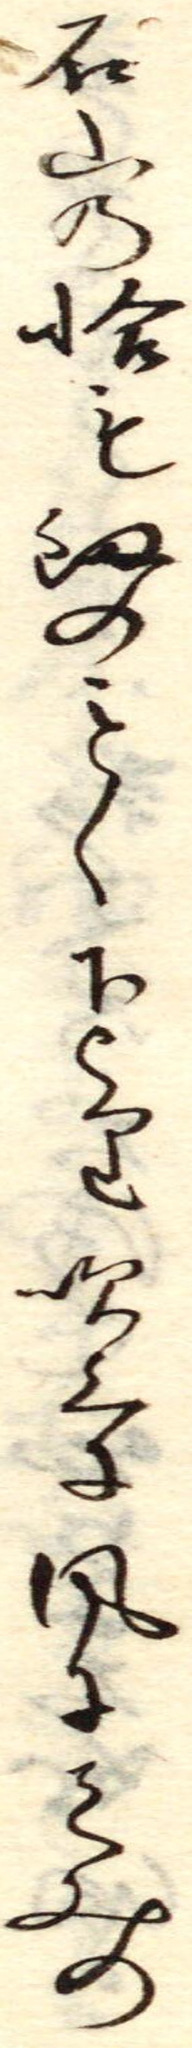石山の恰も釼のことく下より吹上に風にてみの
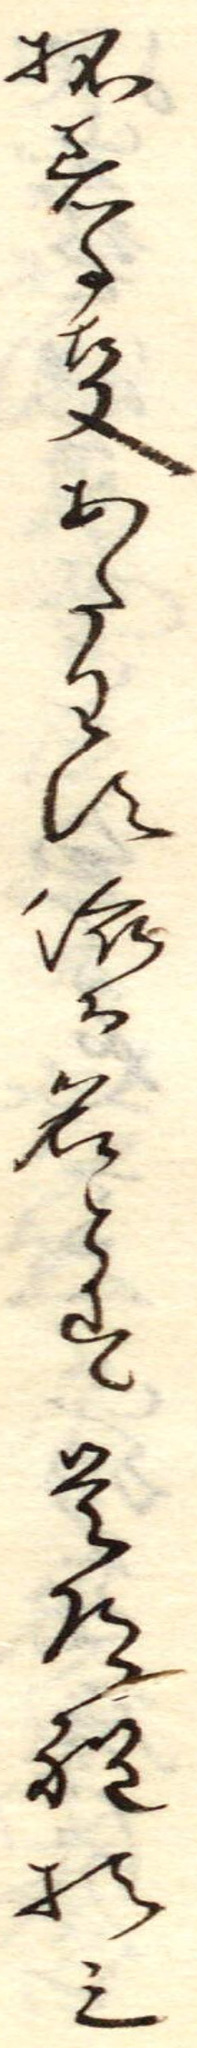抔着る事あたわす依而名とす是道程拾三
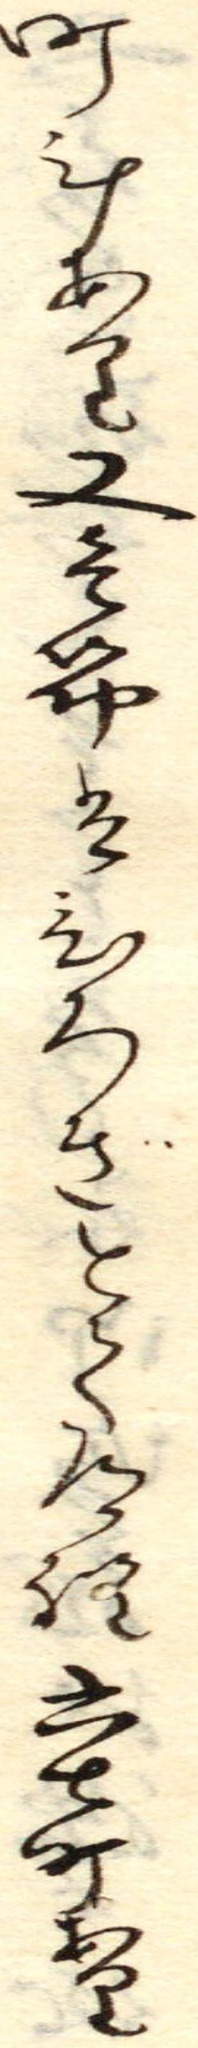町斗あり又壱筋はひろざとて道程六七町あり

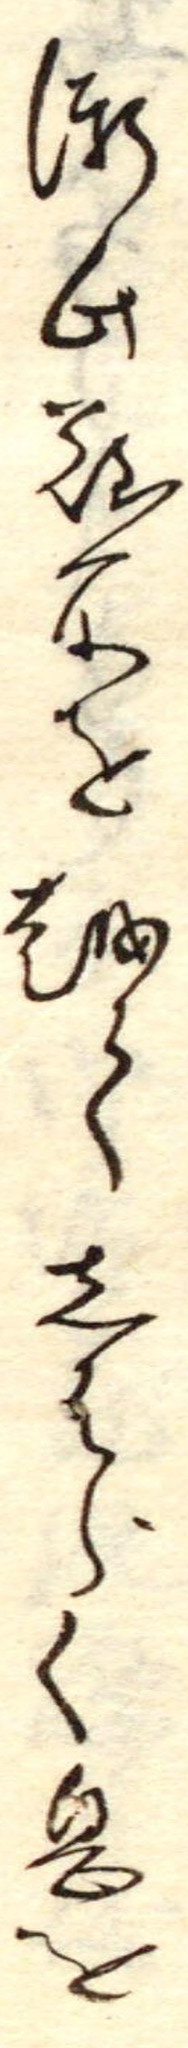漸此難所を越てしはらく息を
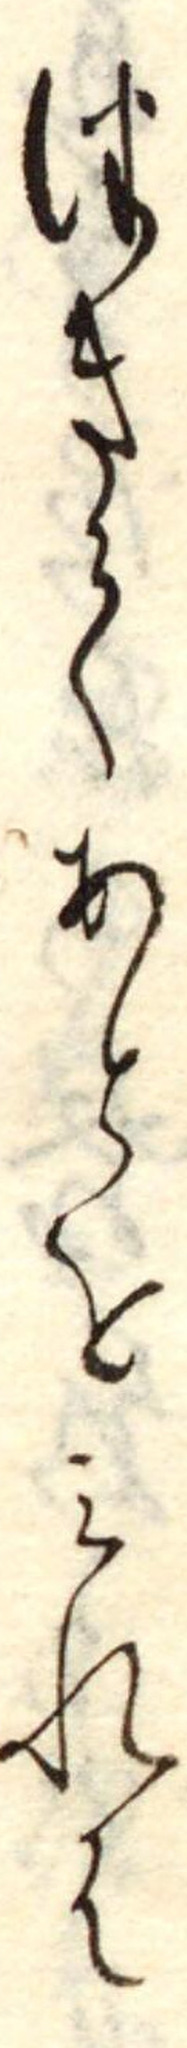つきてあとをみては
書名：能登名跡誌
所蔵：Ishikawa Prefectural Library
